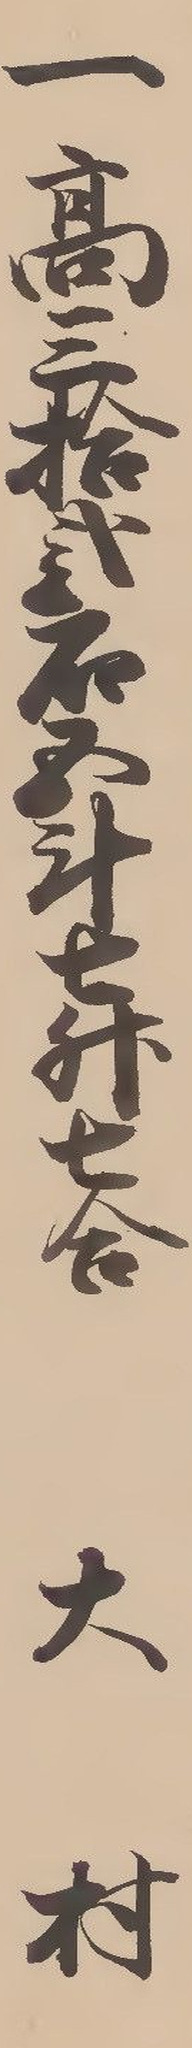一高三拾弐石五斗七升七合大村
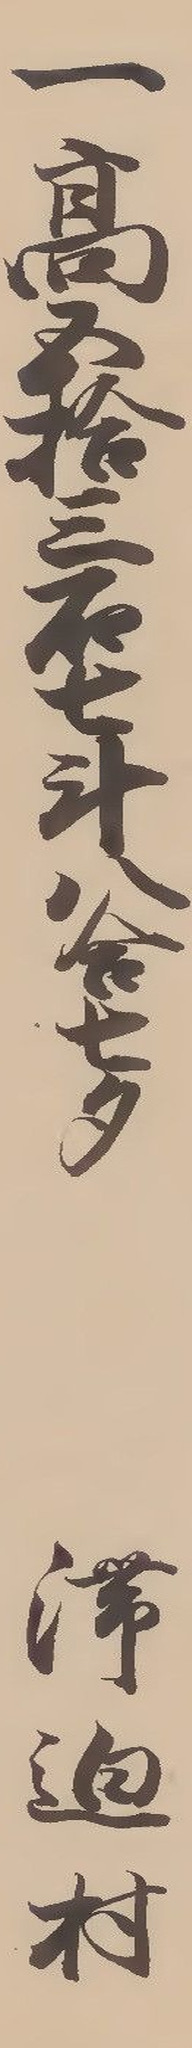一高五拾三石七斗八合七勺滞迫村
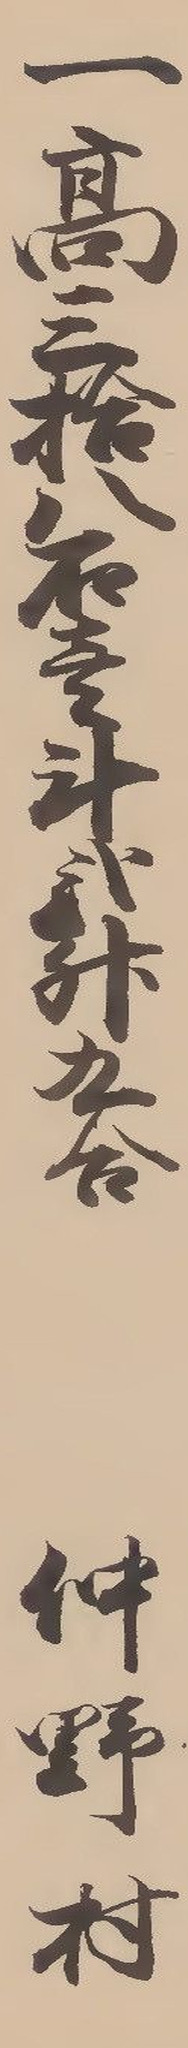一高三拾八石壱斗弐升九合仲野村
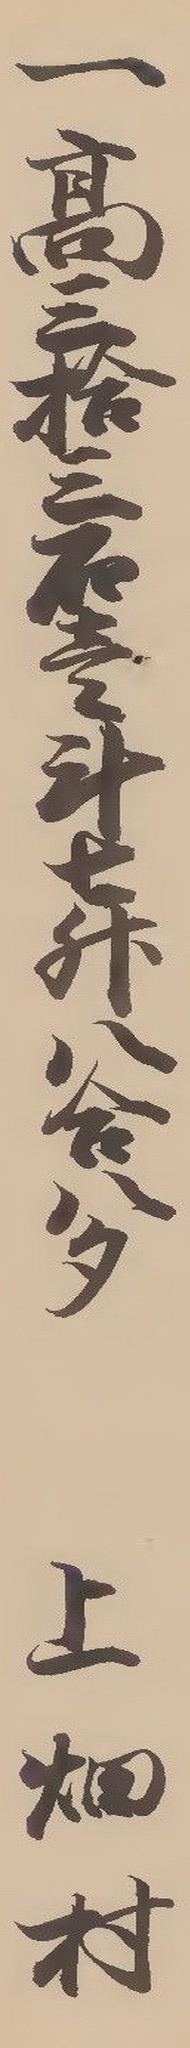一高三拾三石壱斗七升八合八勺上畑村

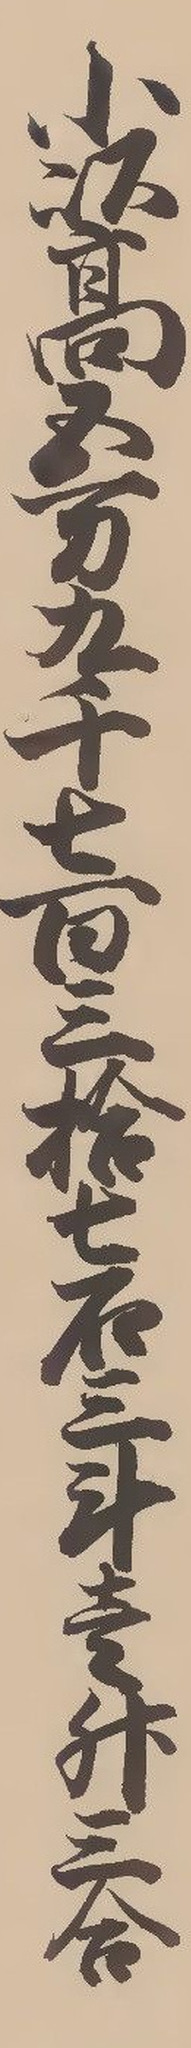小以高五万九千七百三拾七石三斗壱升三合
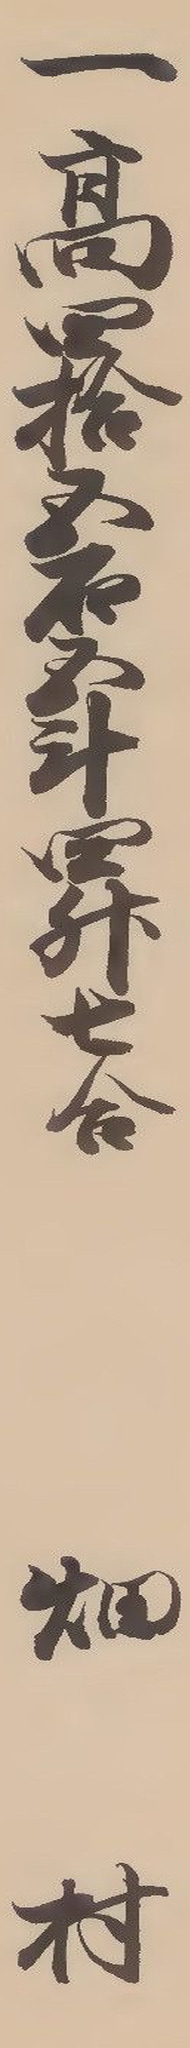一高四拾五石五斗四升七合畑村
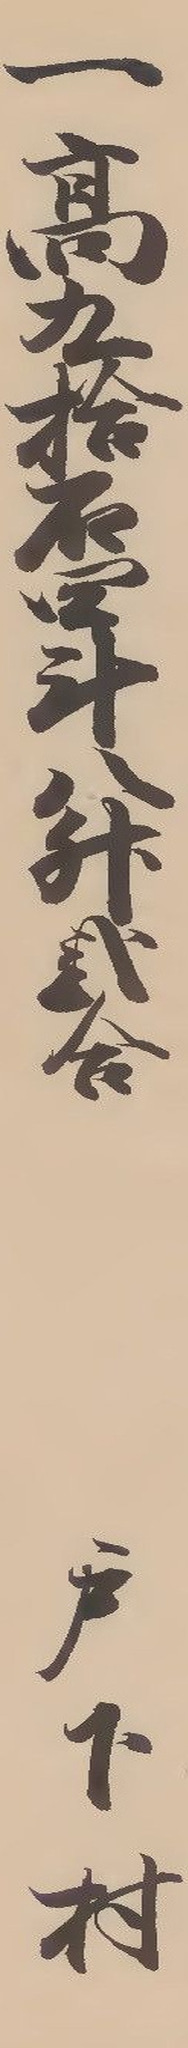一高九拾石四斗八升弐合戸下村
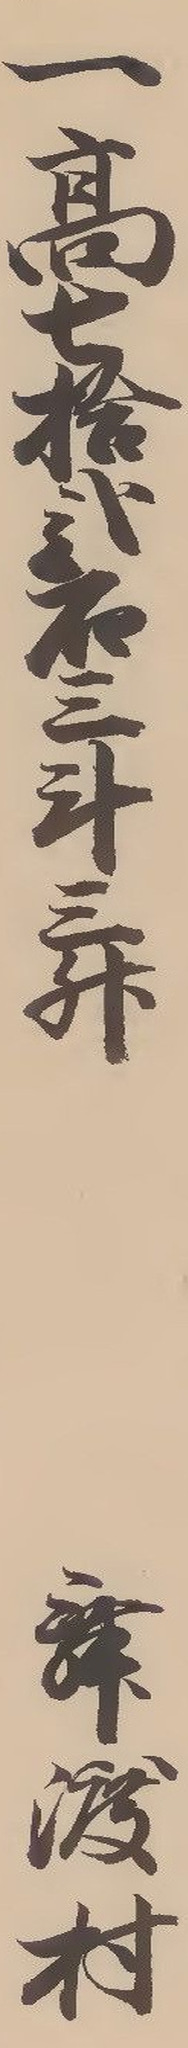一高七拾弐石三斗三升舞渡村

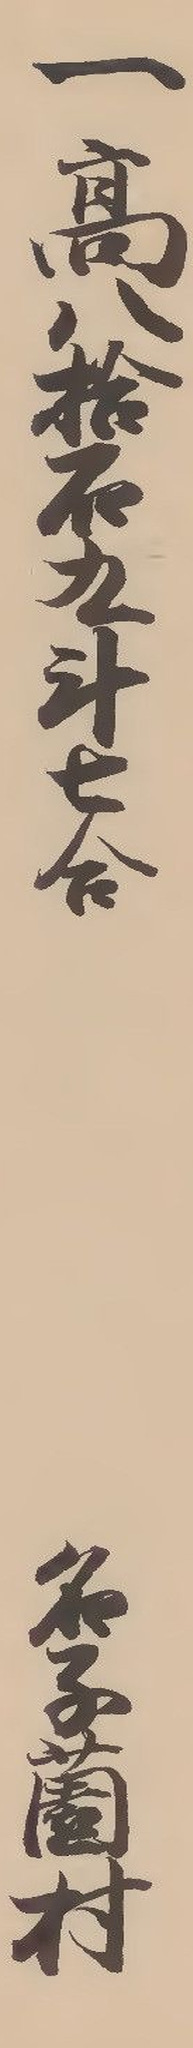一高八拾石九斗七合名子園村
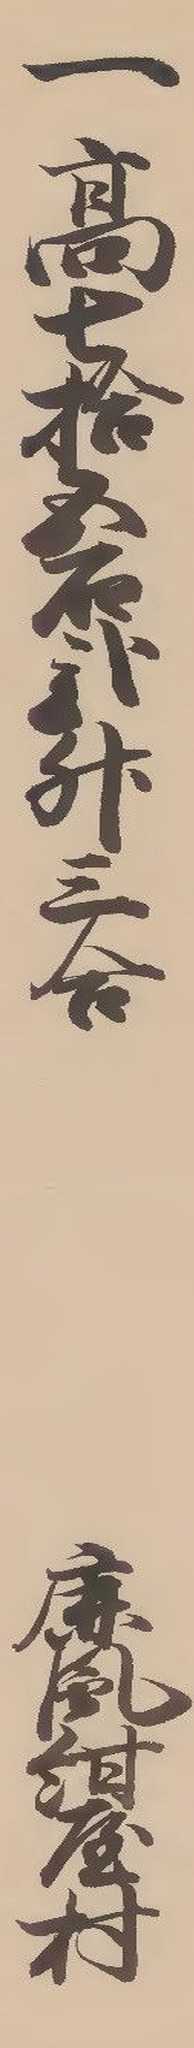一高七拾五石弐升三合鹿風紺屋村
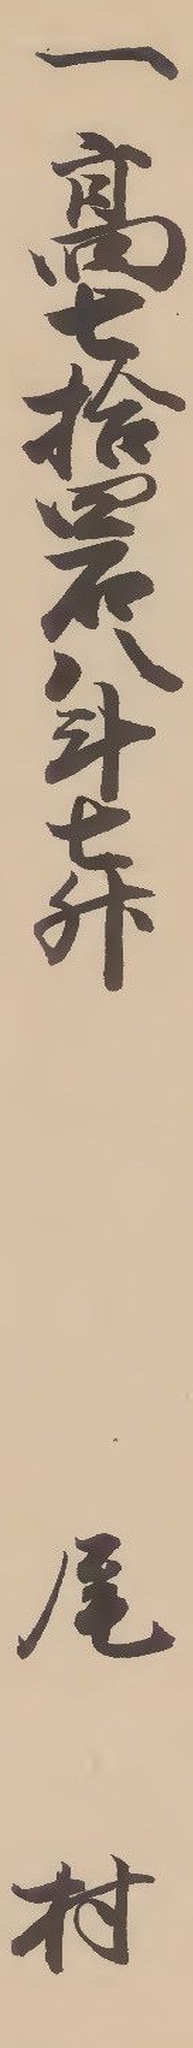一高七拾四石八斗七升尾村
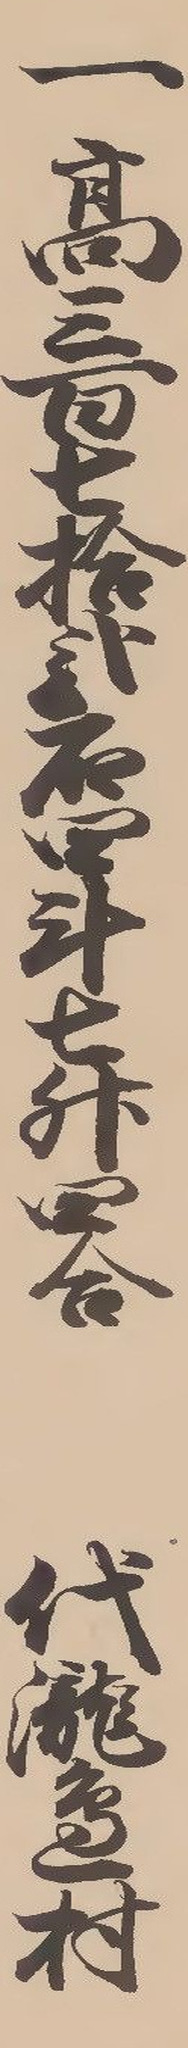一高三百七拾弐石四斗七升四合代滝辺村
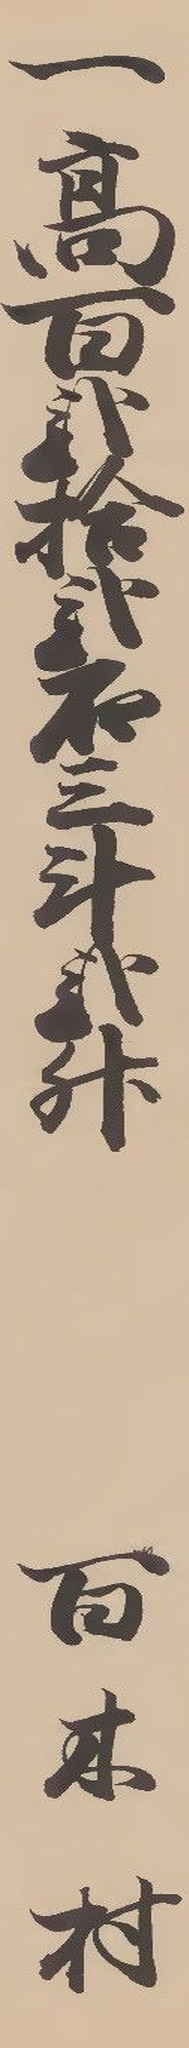一高百弐拾弐石三斗弐升百木村
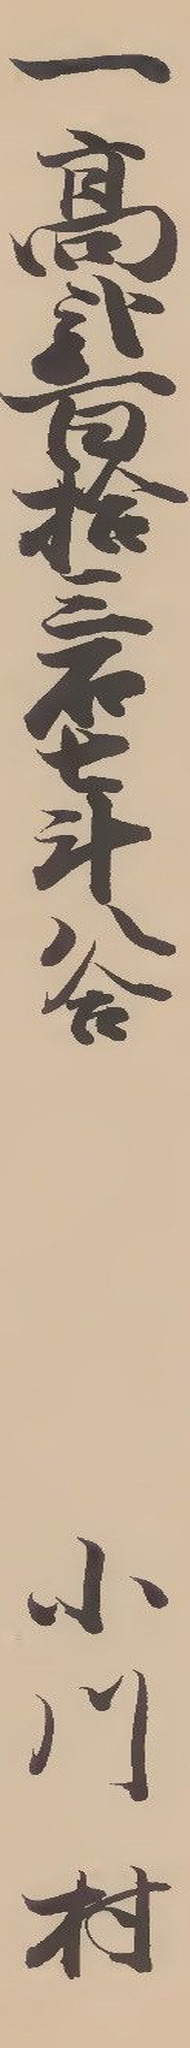一高弐百拾三石七斗八合小川村
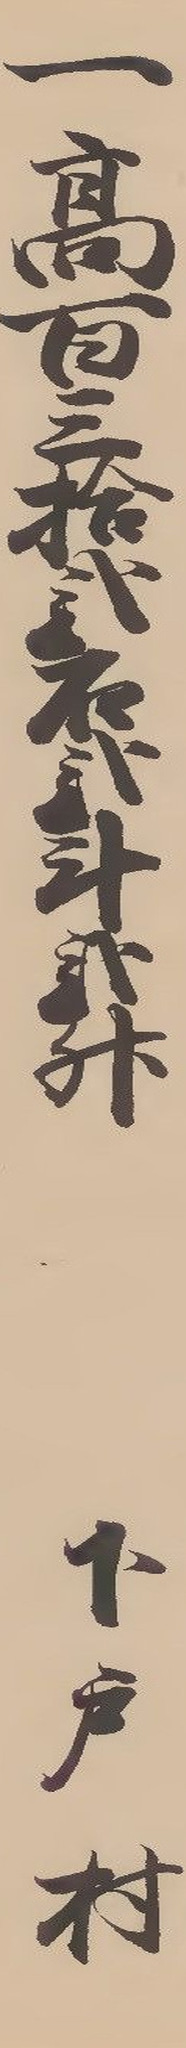一高百三拾弐石弐斗弐升下戸村
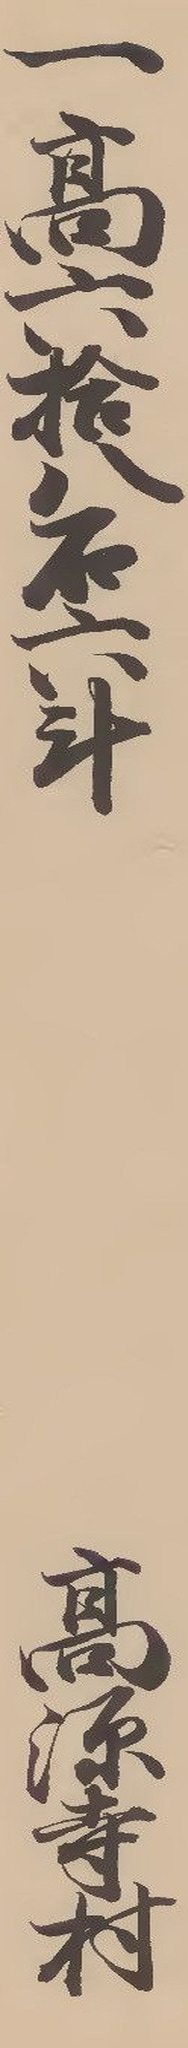一高六拾八石六斗高源寺村
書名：豊後国郷帳
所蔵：国立公文書館 National Archives of Japan
